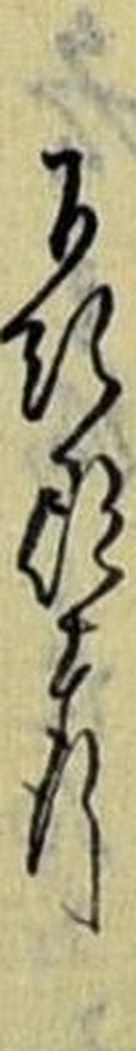下領郡奉行
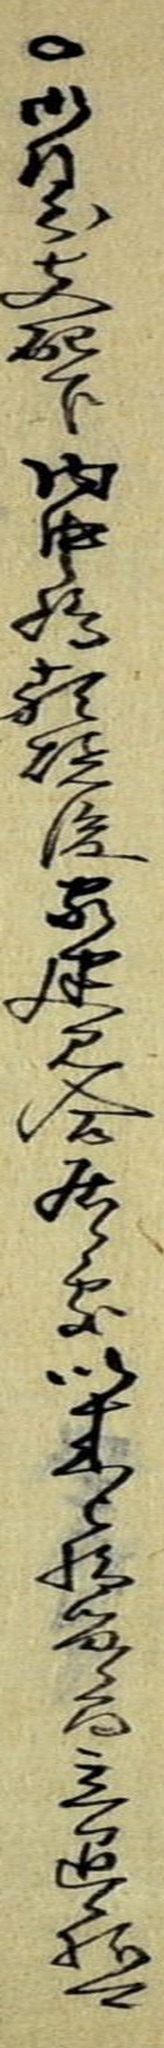○御自分支配下内中嶋類焼後家建見合居候処以来被指留候間立退候様可
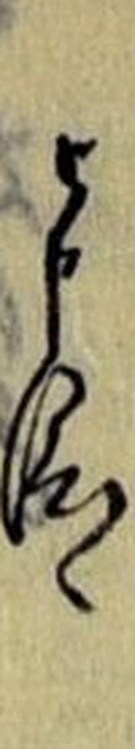被申渡候
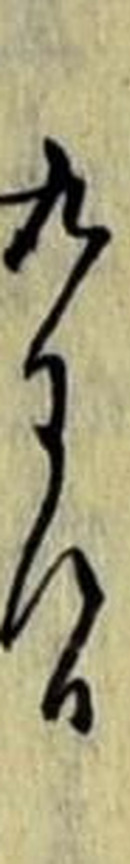九月八日
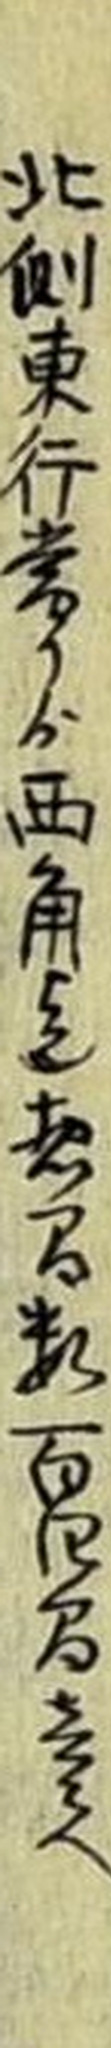横町通北側東行当りゟ西角迄惣間数百四間壱尺
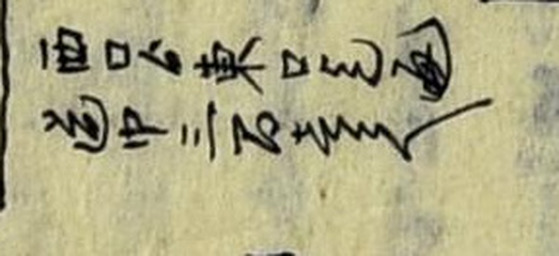道巾三間壱尺西
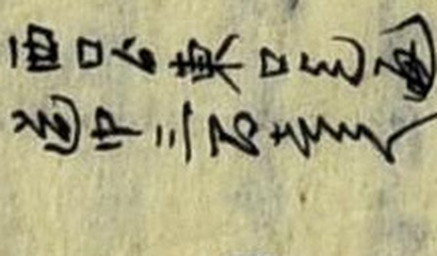道巾三間壱尺西
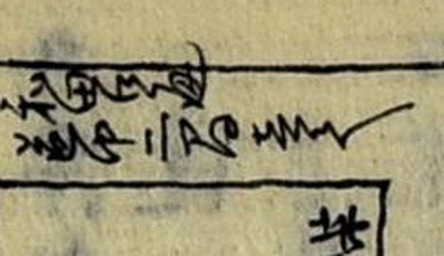道巾二間壱尺
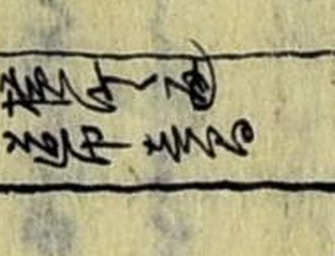道巾二間
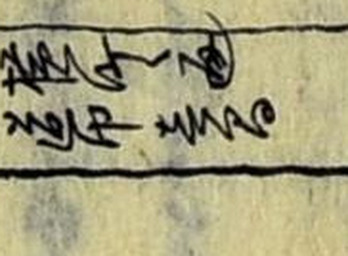道巾二間
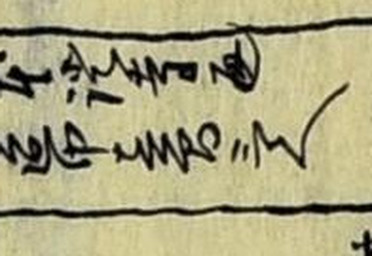道巾壱間三尺
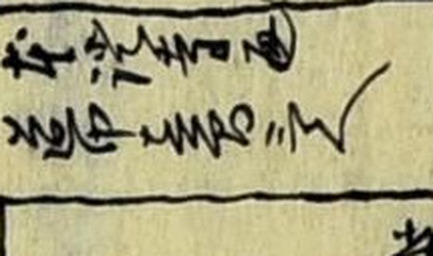道巾壱間三尺
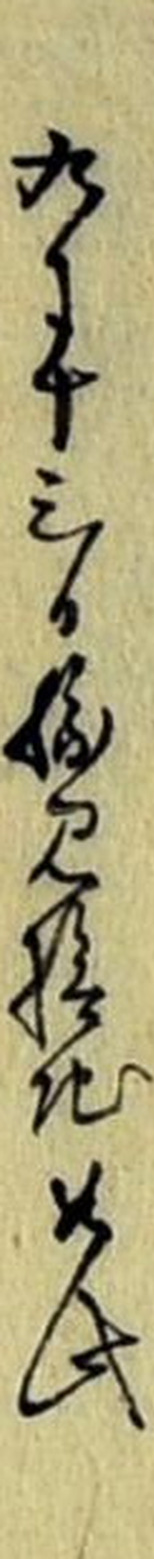九月十三日勝見給地如此

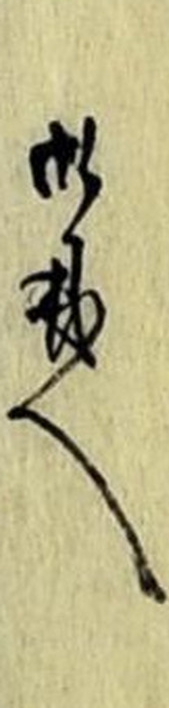御用人
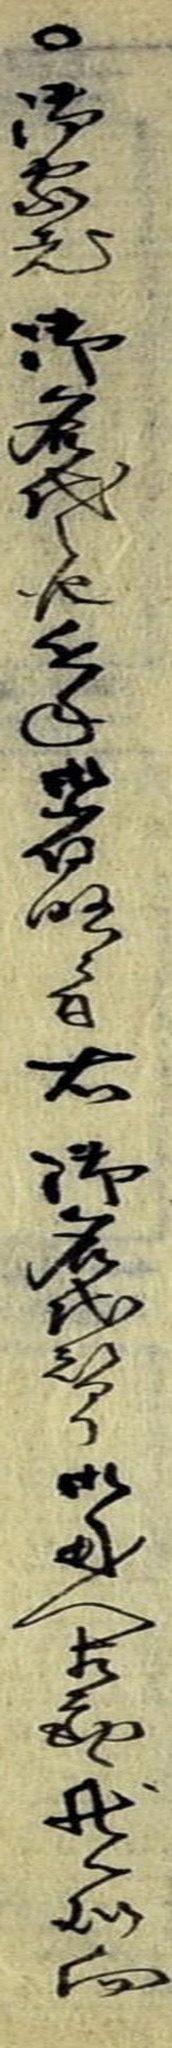○御家老御名代之儀近年御省略に付右御名代替り御用人相勤候然ル処向
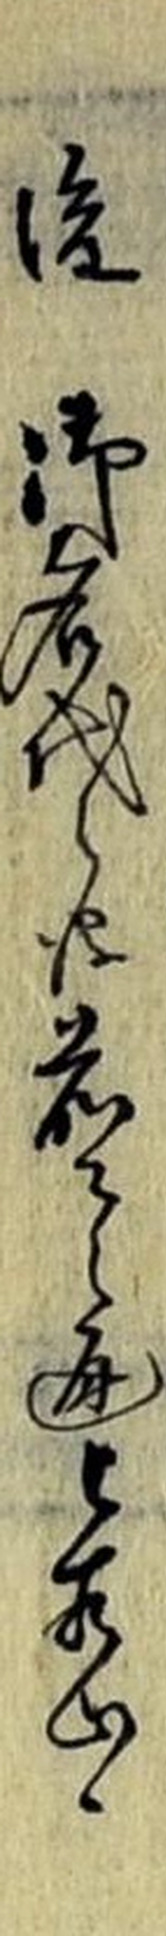後御名代之儀前々之通被相止候
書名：命令之部 四
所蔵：福井県文書館 Fukui Prefectural Archives
